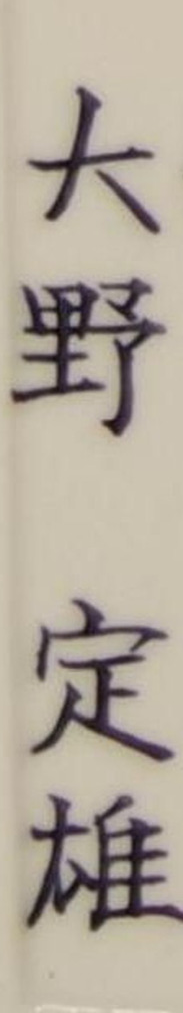大野定雄

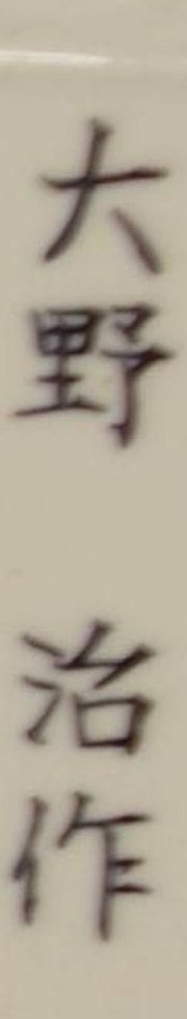大野治作
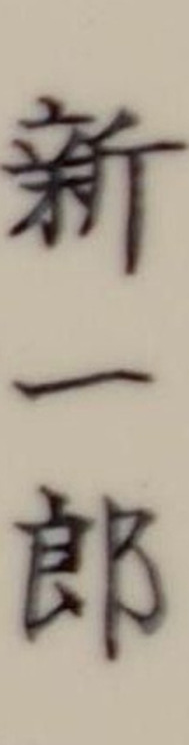新一郎
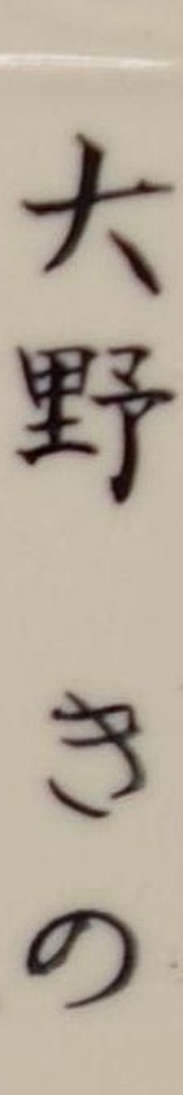大野きの
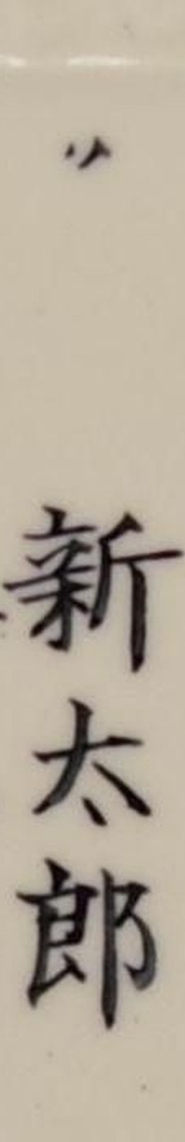新太郎
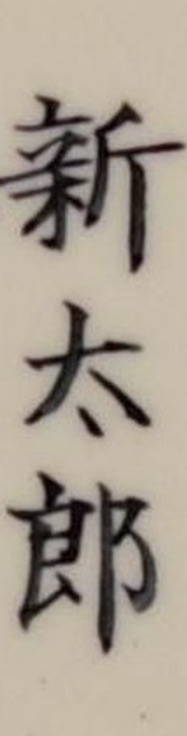新太郎
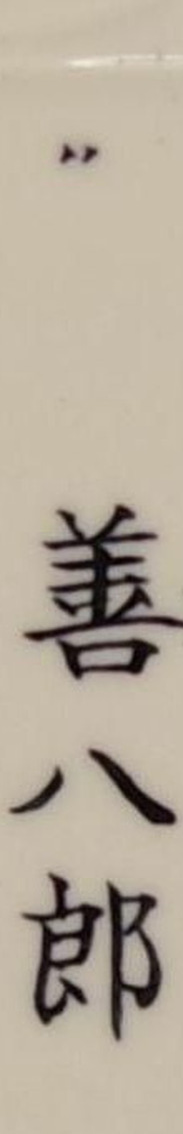善八郎
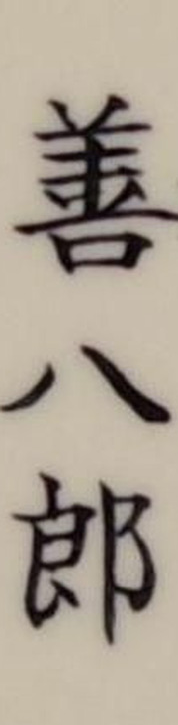善八郎
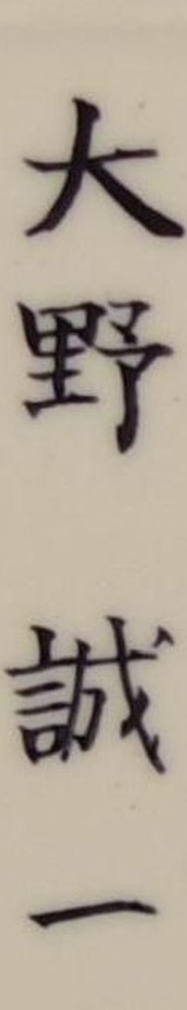大野誠一

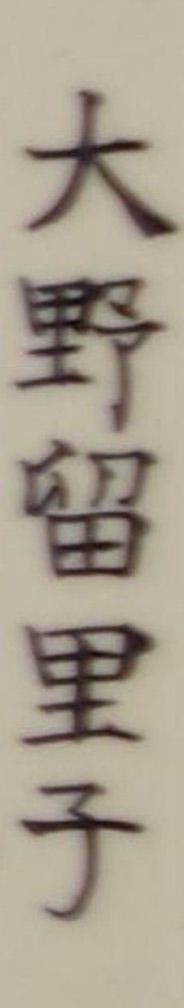大野留里子
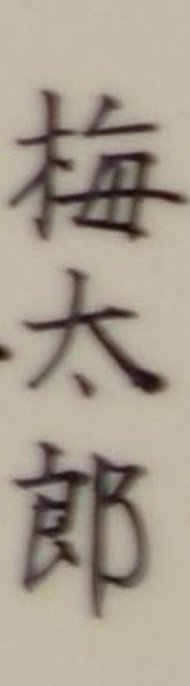梅太郎
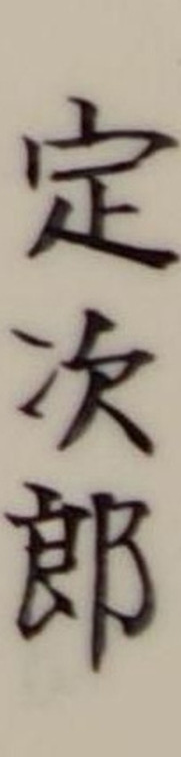定次郎
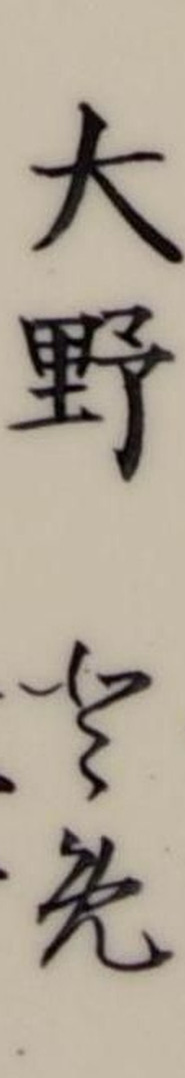大野とめ
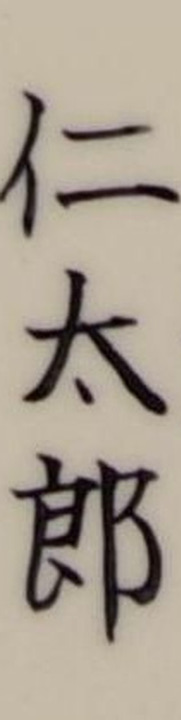仁太郎
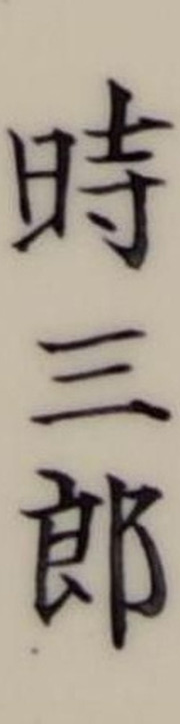時三郎
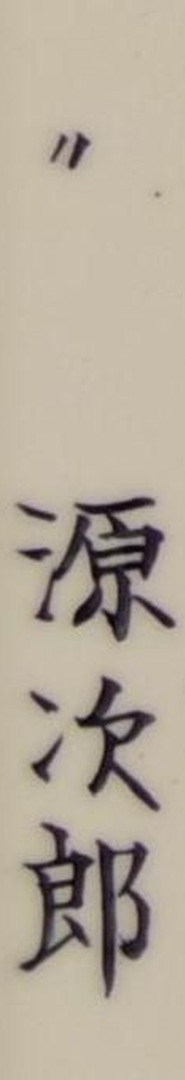源次郎
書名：M~S
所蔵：高野山金剛峯寺
